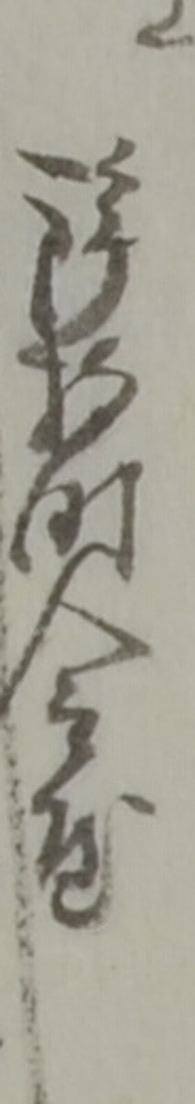鉾持町金屋
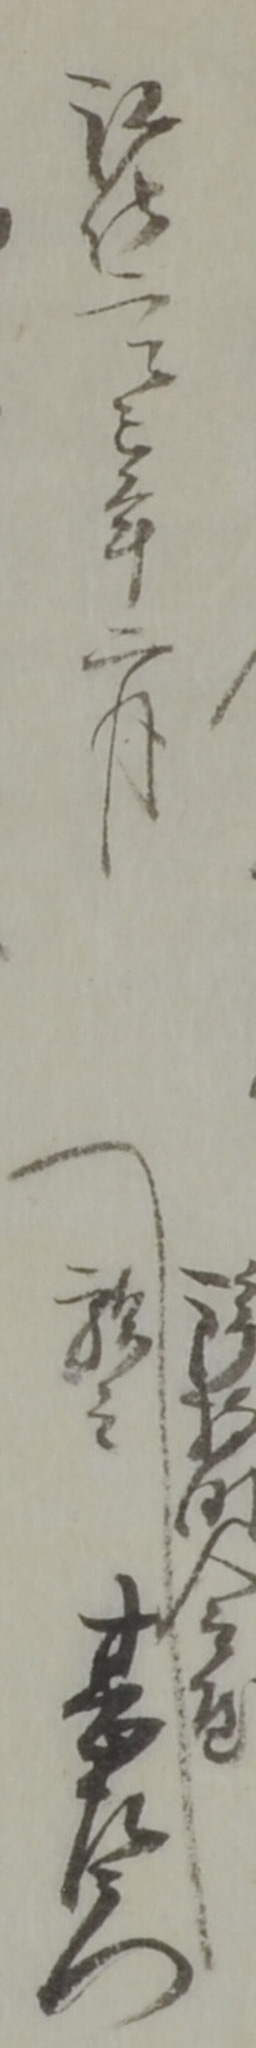弘化二乙巳年二月願主甚左衛門
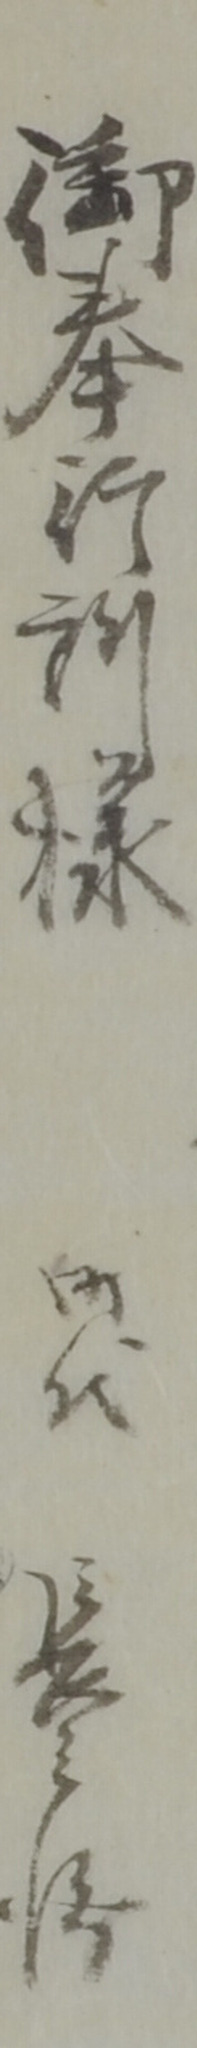御奉行所様町代長兵衛
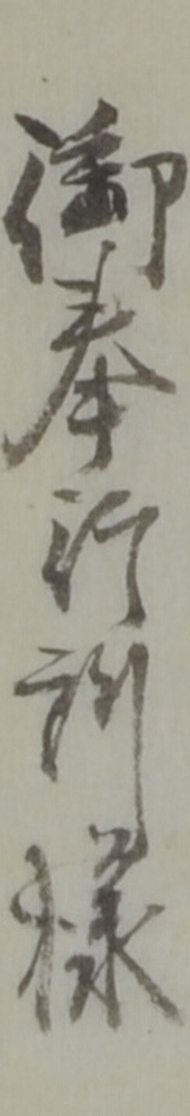御奉行所様
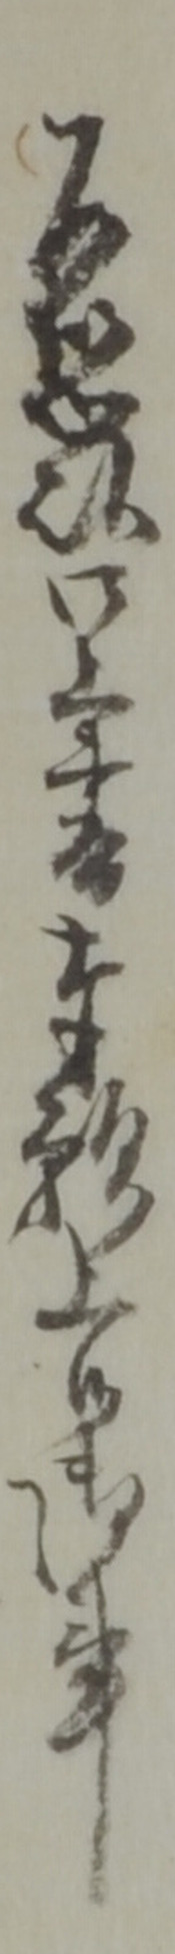乍恐以口上書奉願上候御事
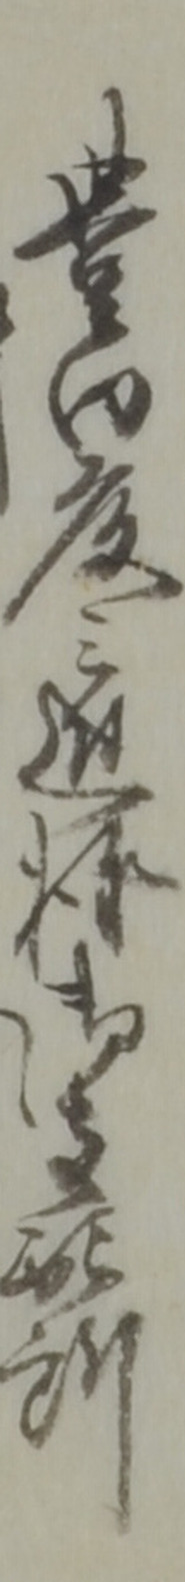豊田藤之進様御支配所
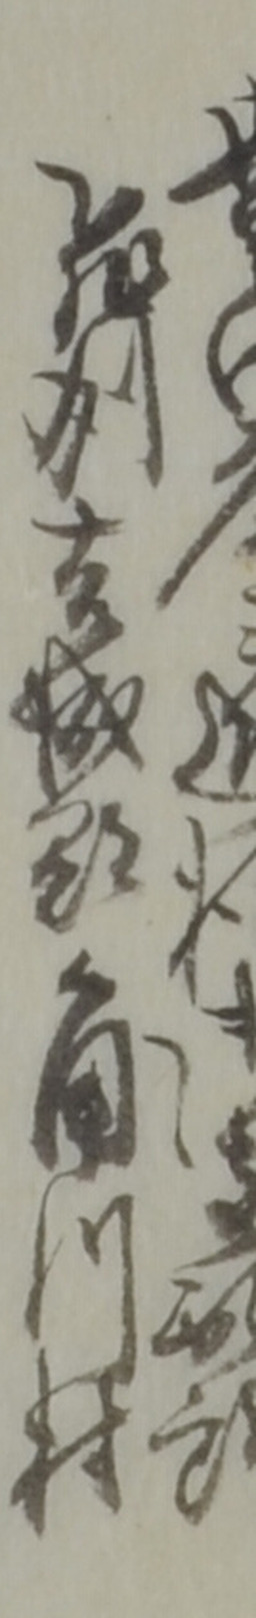飛州吉城郡角川村
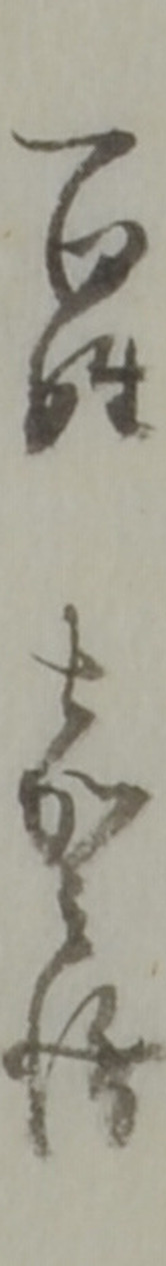百姓嘉兵衛
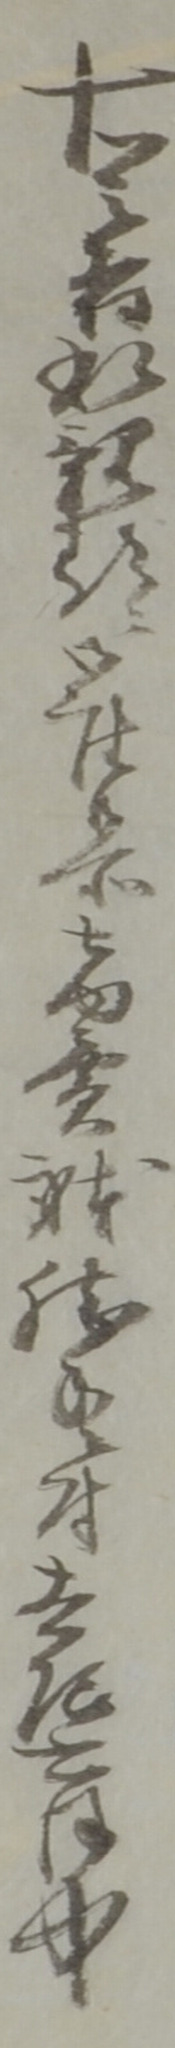右之者私親類ニ御座候所商売体勝手ニ付去辰六月中
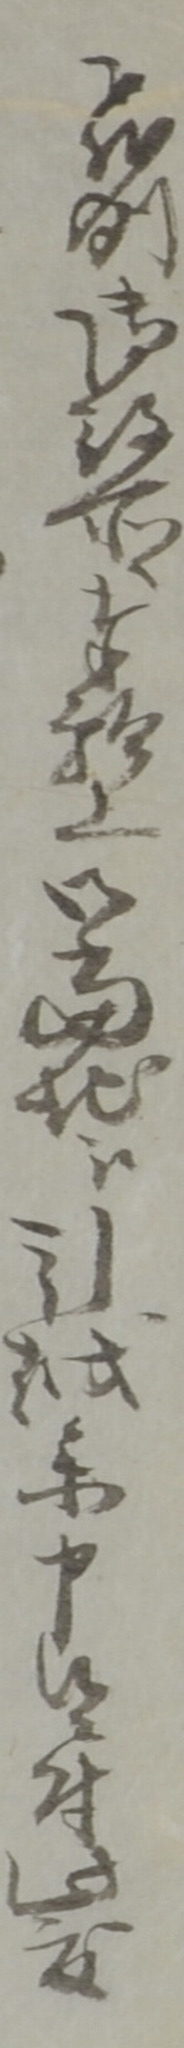飛州御役所へ奉願上御当地江引越参申候ニ付此度
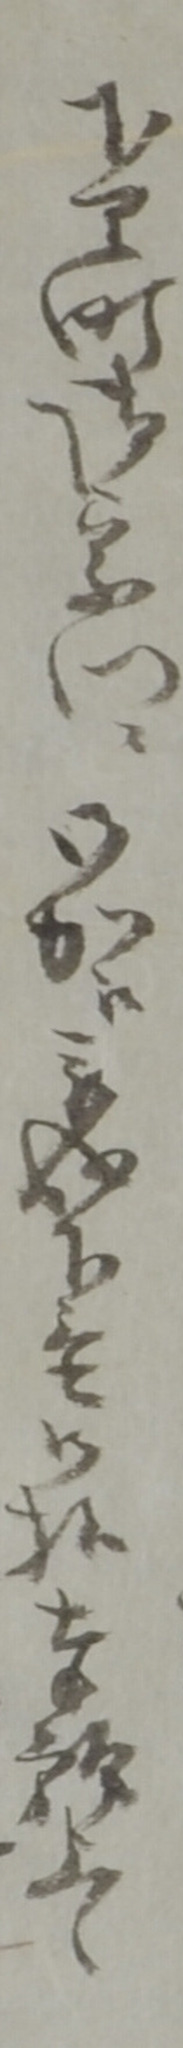下里町御宗門ニ御加江被成下置候様奉願上候
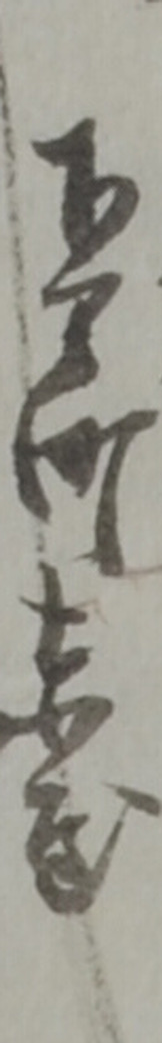下里町京屋
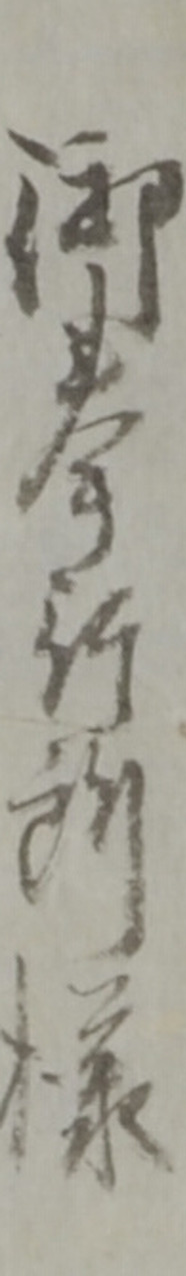御奉行所様
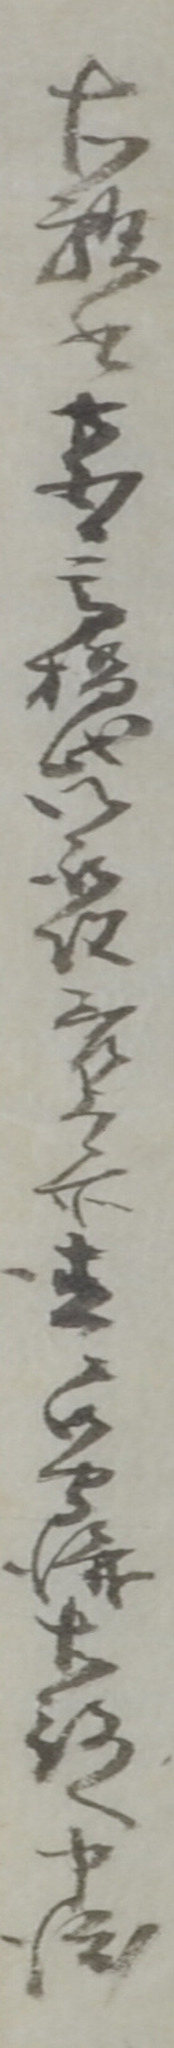右願書廿五日高橋氏御取次差上候所直ニ御聞済右役へ申渡候

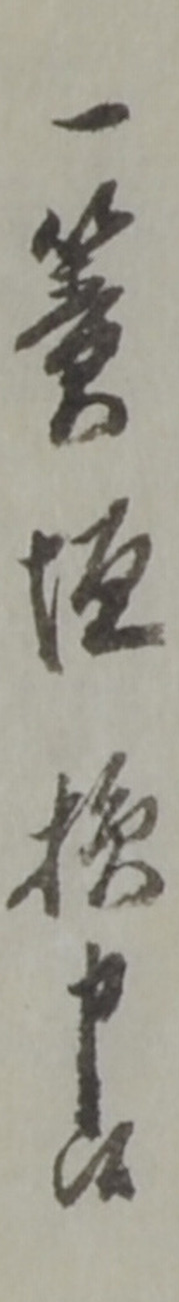一箕垣損申候
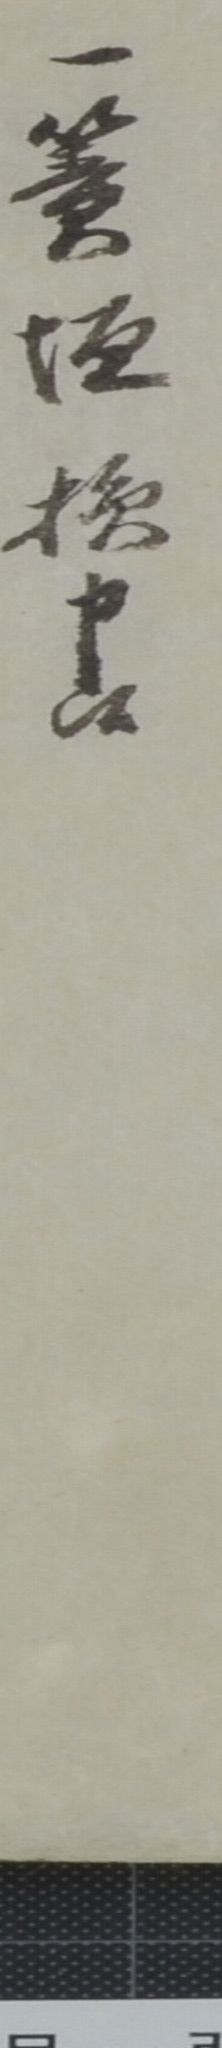一箕垣損申候
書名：諸願書控簿
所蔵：伊那市立高遠町図書館・合同会社AMANE
